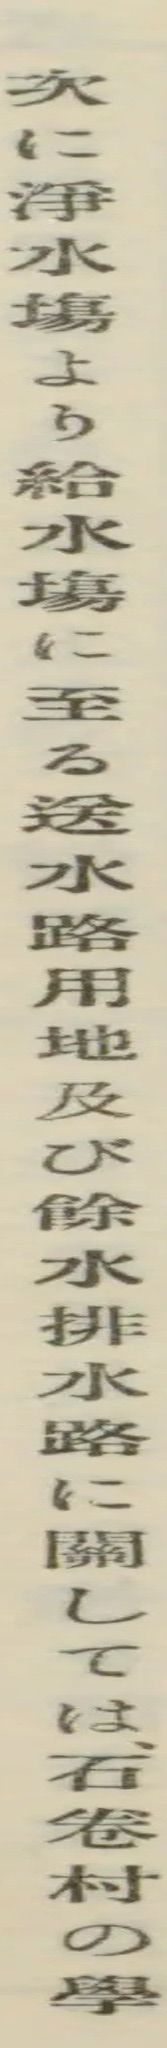次に浄水場より給水場に至る送水路用地及び余水排水路に関しては、石巻村の学
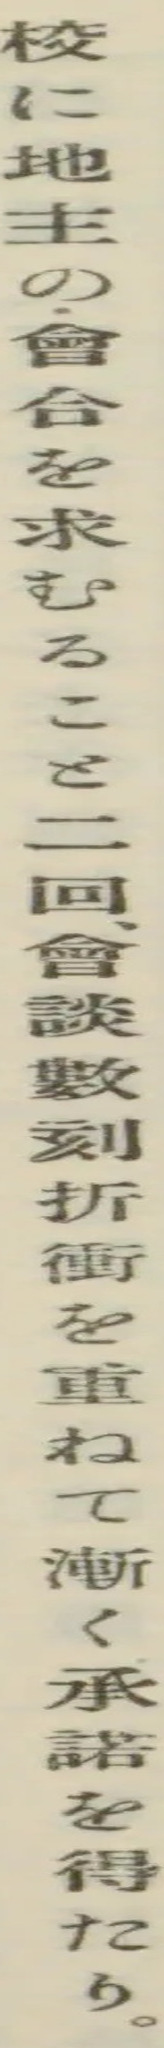校に地主の会合を求むること二回、会談数刻折衝を重ねて漸く承諾を得たり。
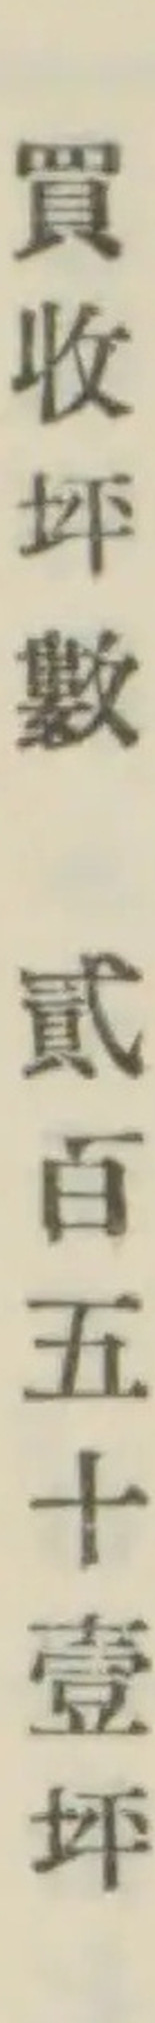買収坪数貳百五十壹坪
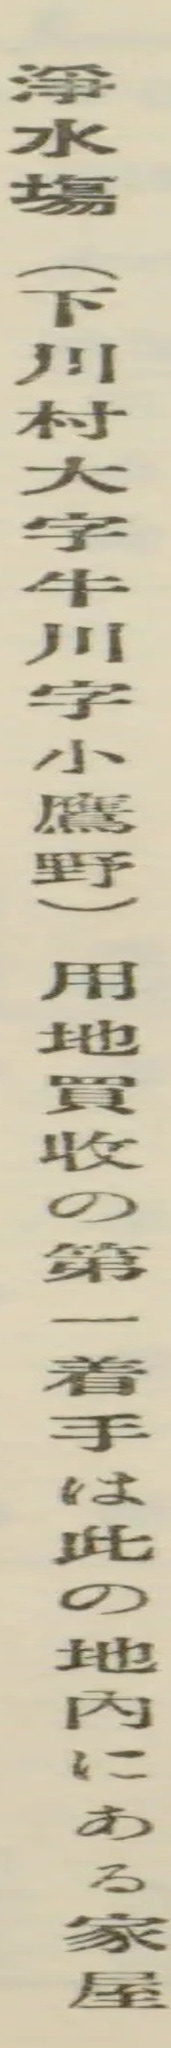浄水場(下川村大字牛川字小鷹野)用地買収の第一着手は此の地内にある家屋
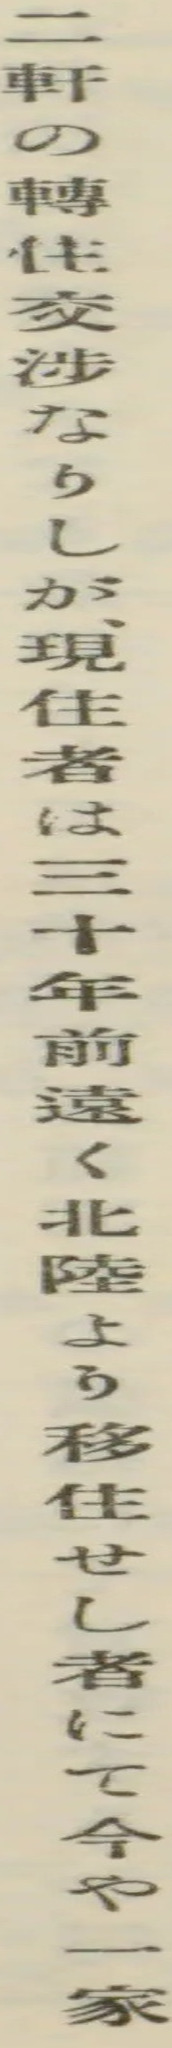二軒の転住交渉なりしが、現住者は三十年前遠く北陸より移住せし者にて今や一家
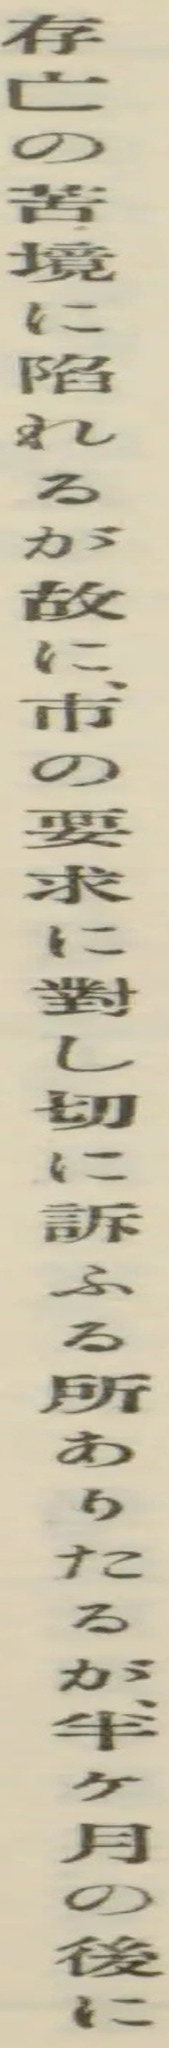存亡に苦境に陥れるが故に、市の要求に対し切に訴ふると所ありたるが、半か月の後に
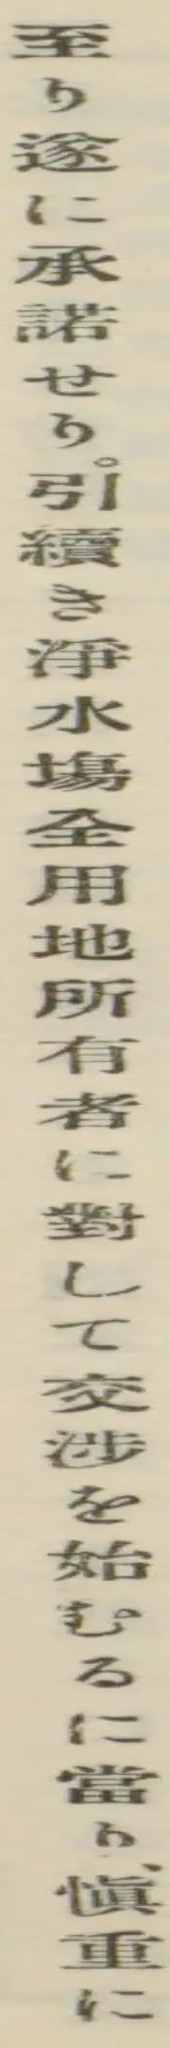至り遂に承諾せり。引続き浄水場全用地所有者に対して交渉を始むるに当り、慎重に
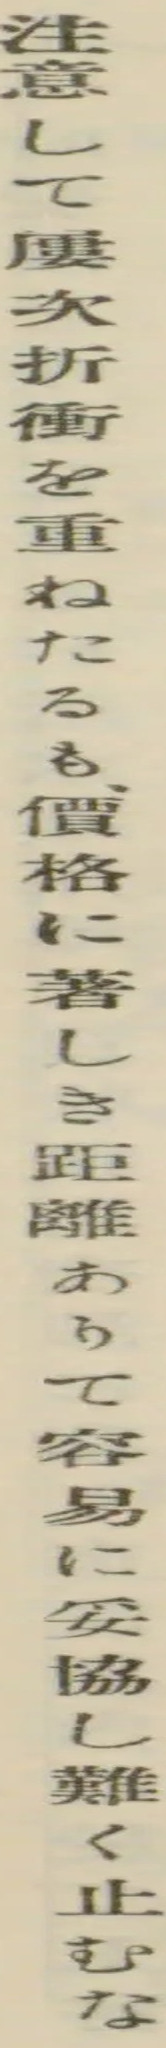注意して屢次せｓ折衝を重ねたるも、価格に著しき距離ありて容易に妥協し難く止むな

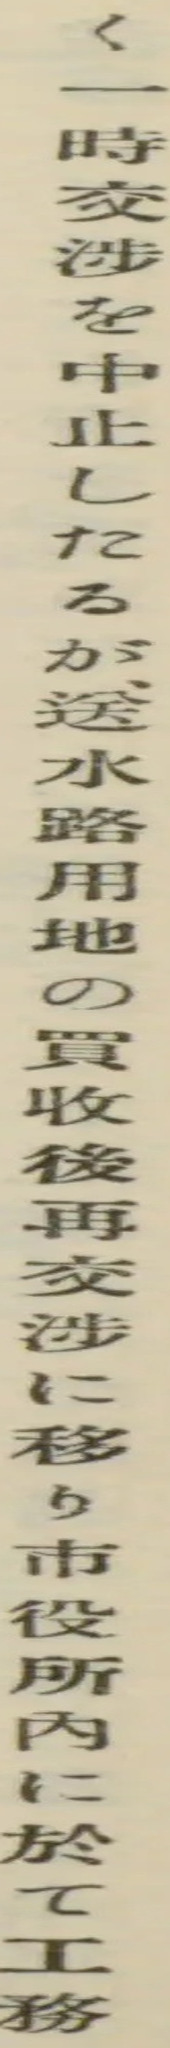く一時交渉を中止したるが、送水路用地の買収後再交渉に移り市役所内に於て工務
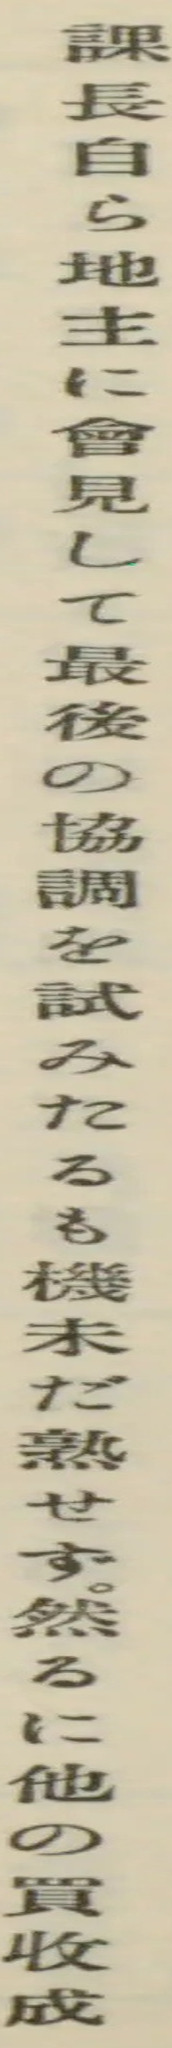課長自ら地主に会見して最後の協調を試みたるも機未だ熟せず。然るに他の買収成
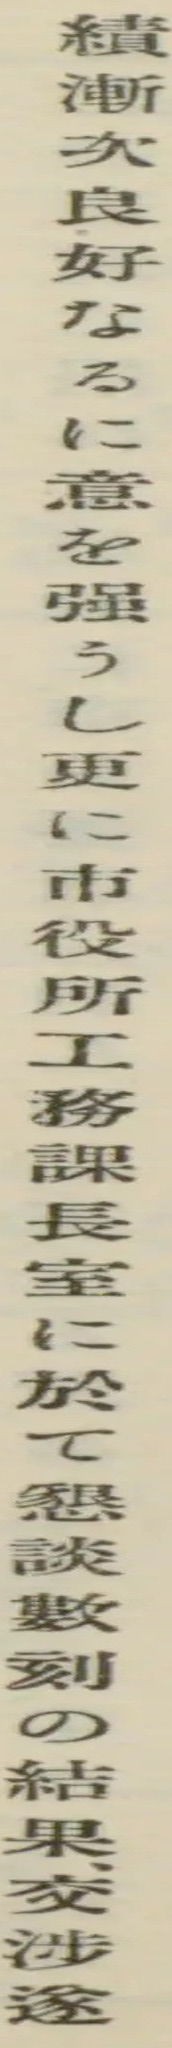積ｚ漸次良好なるに意を強うし更に市役所工務課長室に於てっ懇談数刻ｎの結果、交渉遂
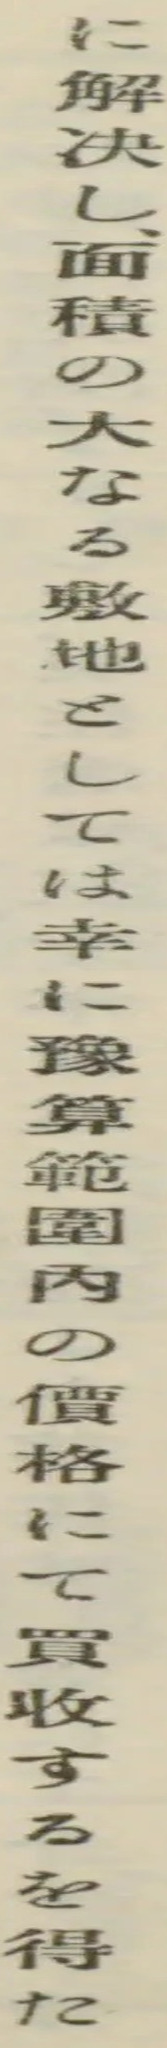に解決し、面積の大なる敷地としては幸に予算範囲内の価格にて買収するを得た
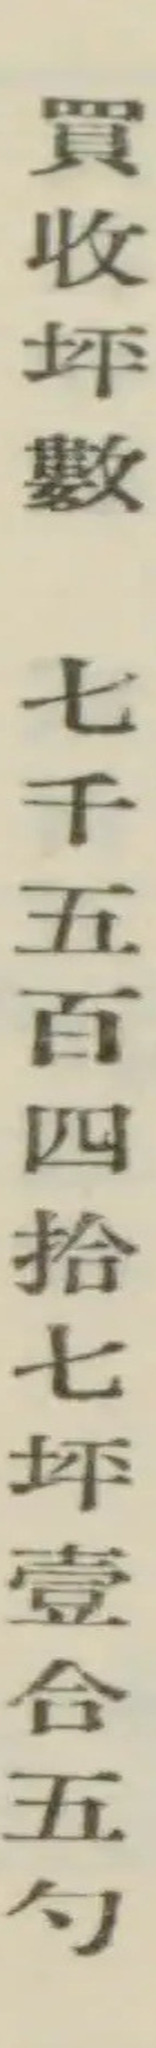買収坪数七千五百四拾七坪壹合五勺
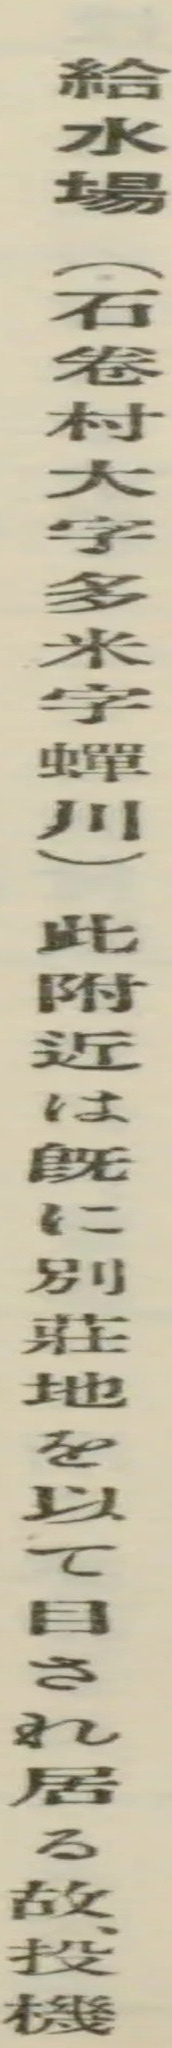給水場(石巻村大字多米字蝉川)此付近は既に別荘地を以て目され居る故、投機
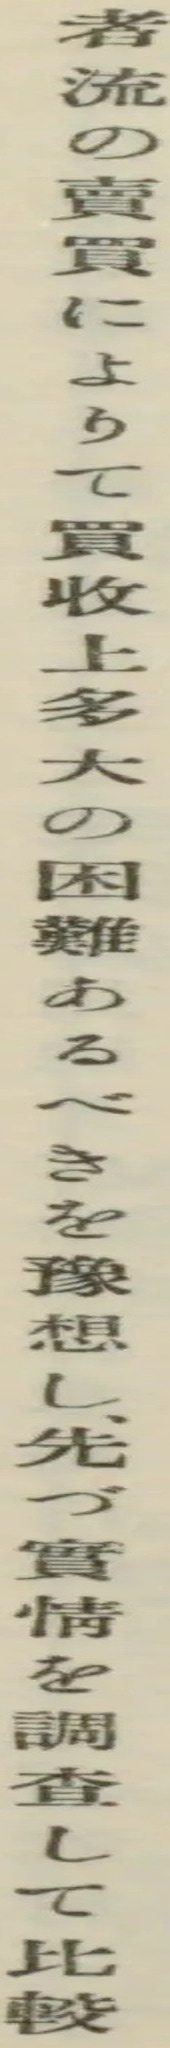者流の売買によりて買収上多大の困難あるべきを予想し、先ず実情を調査して比較
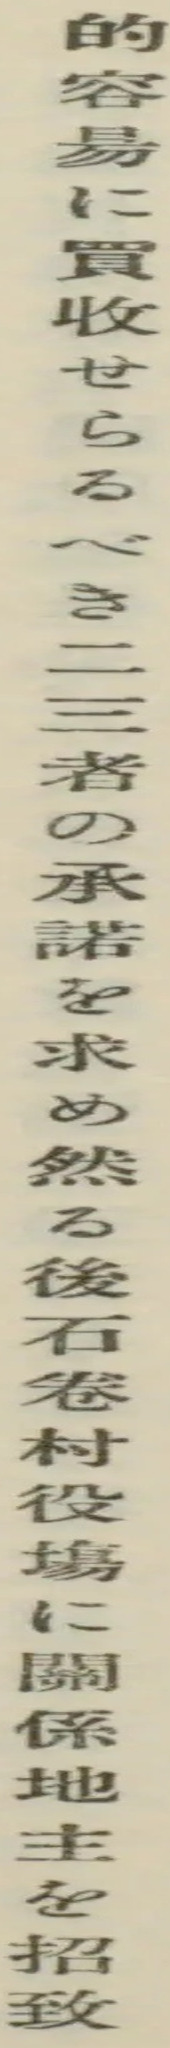的容易に買収せらるべき二三者の承諾を求め然る後石巻村役場にかんけ関係地主を招致
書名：豊橋市水道誌
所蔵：国立国会図書館 National Diet Library, JAPAN
